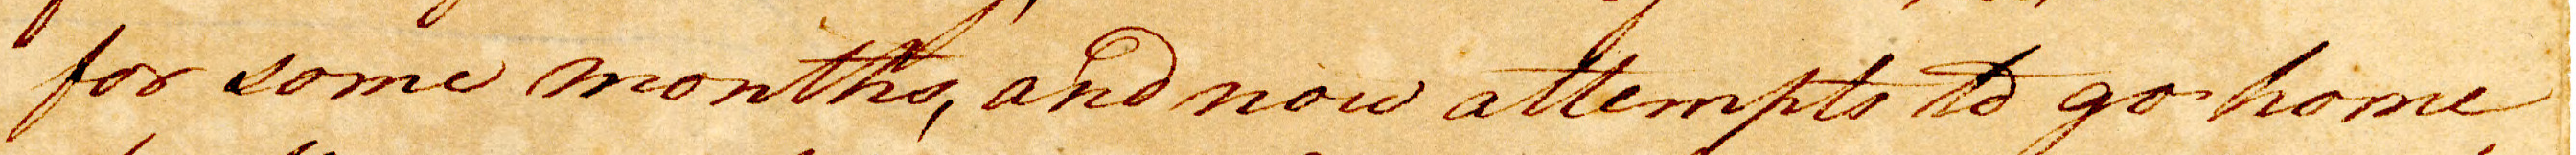for some months, and now attempts to go home
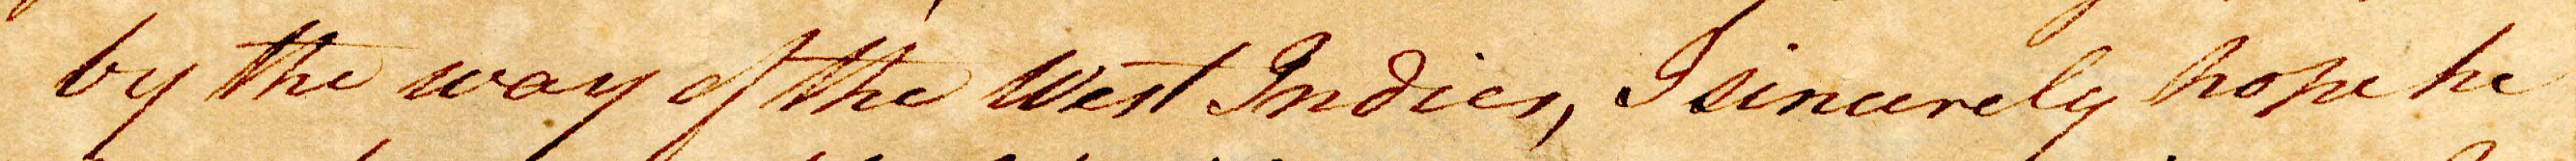by the way of the West Indies, I sincerely hope he
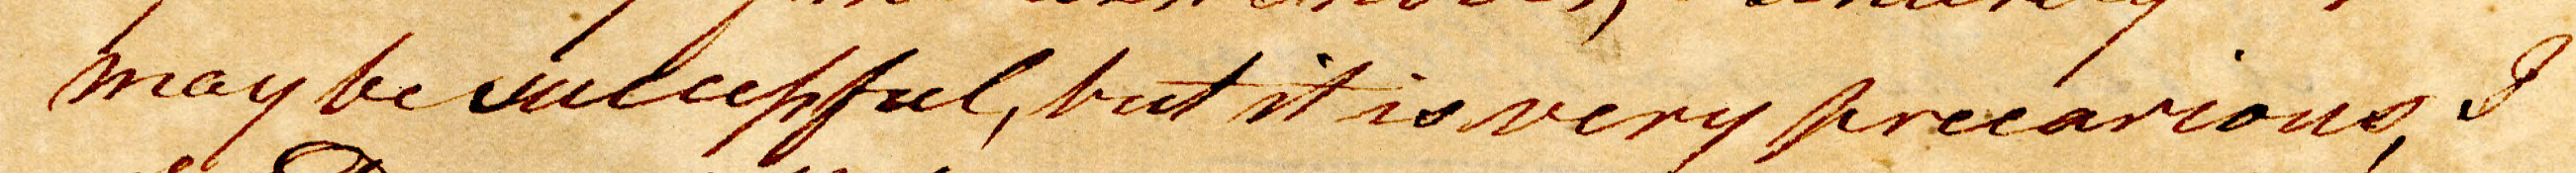may be successful, but it is very precarious, I
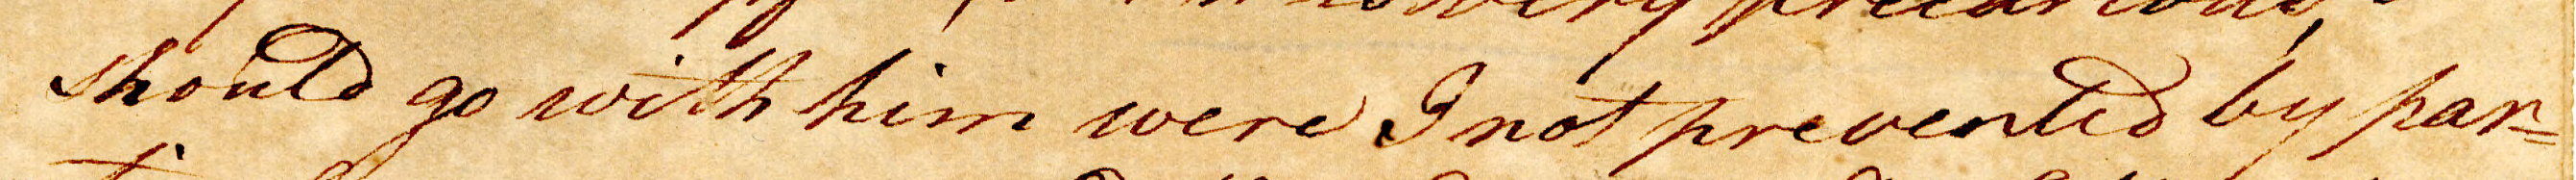should go with him were I not prevented by par-
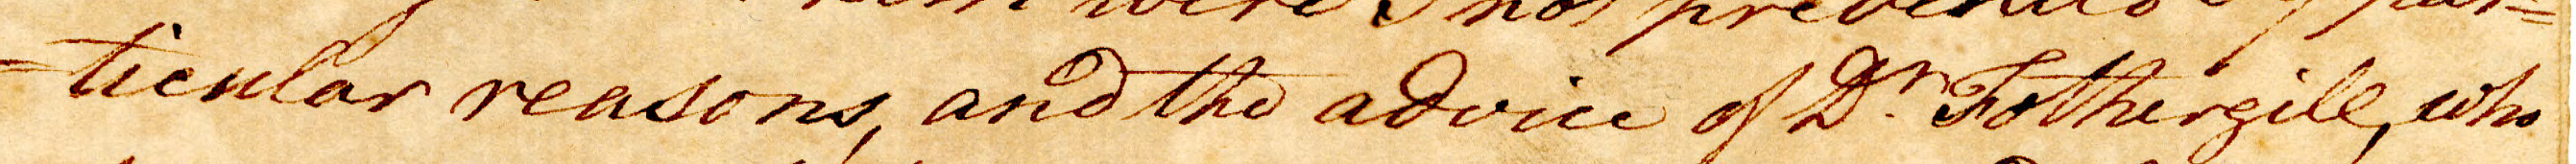-ticular reasons, and the advice of D^r. Fothergill, who
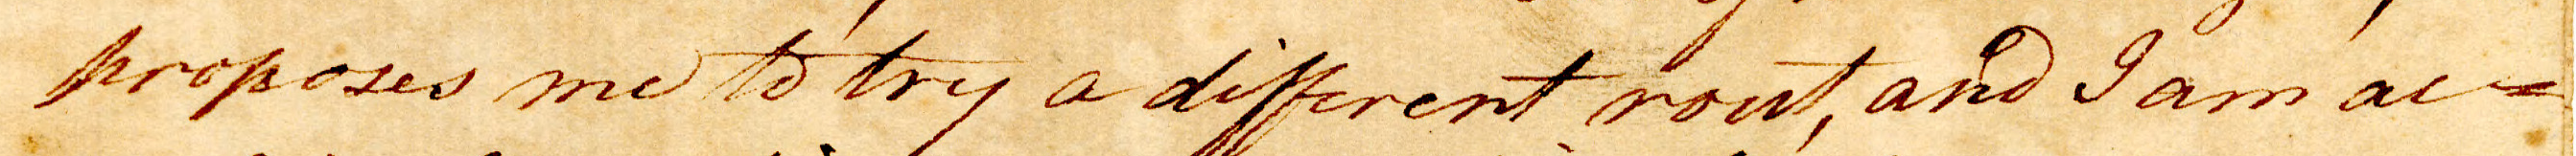proposes me to try a different rout, and I am ac-
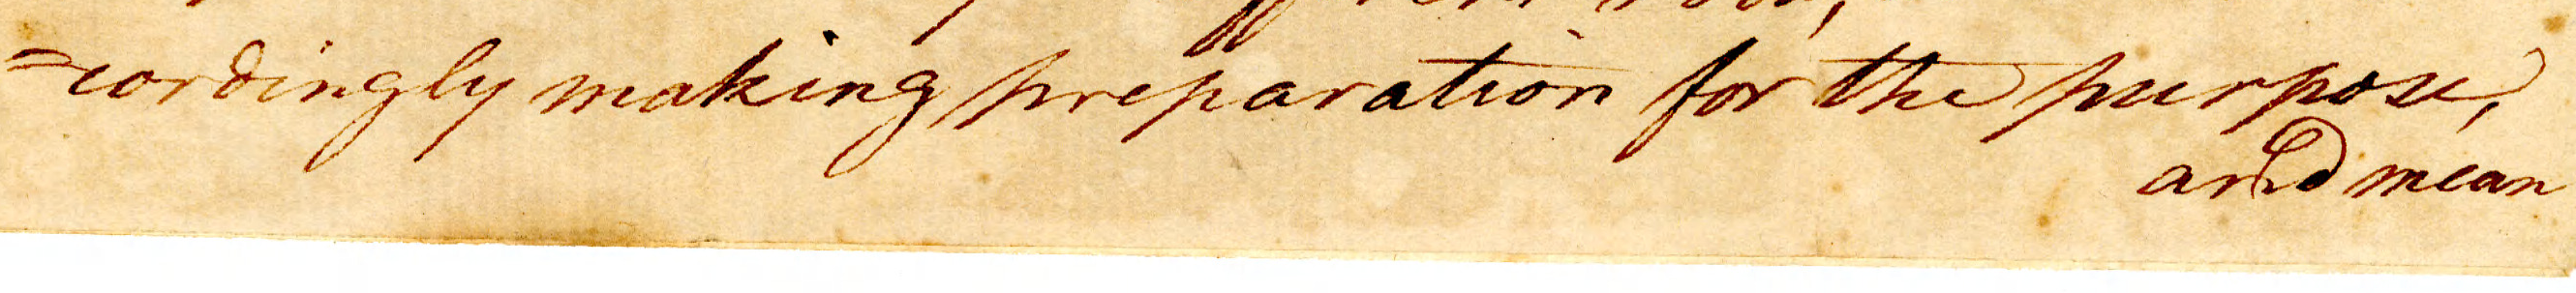-cordingly making preparation for the purpose,
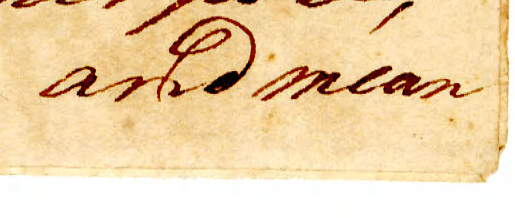and mean
